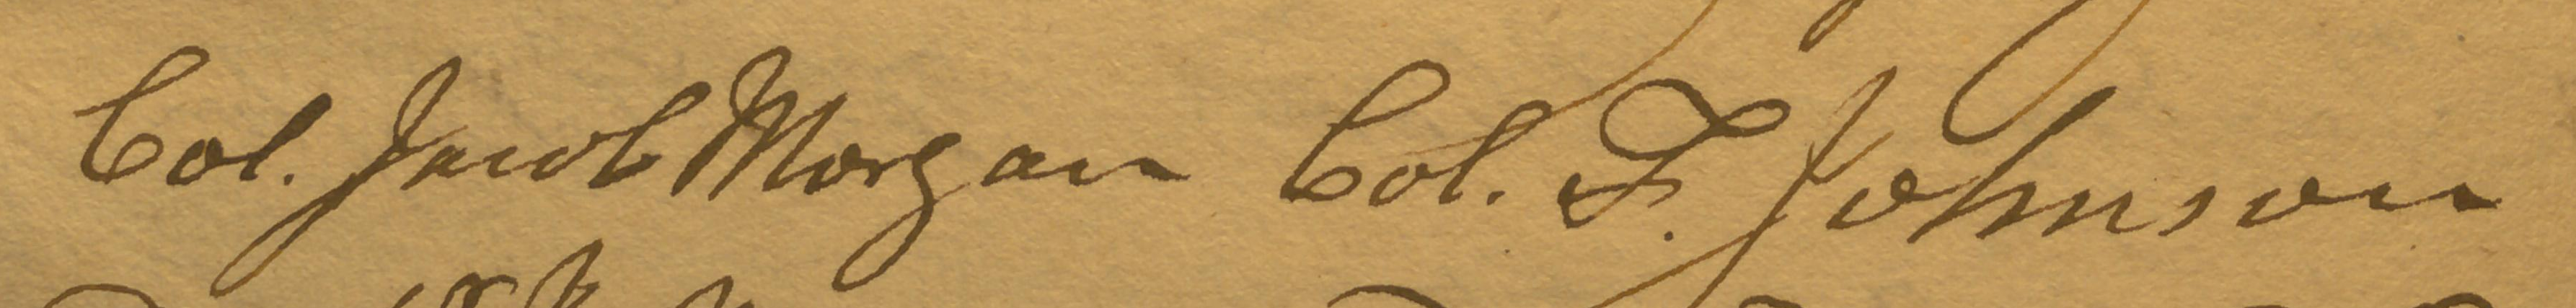Col. Jacol Morgan Col. F Johnson
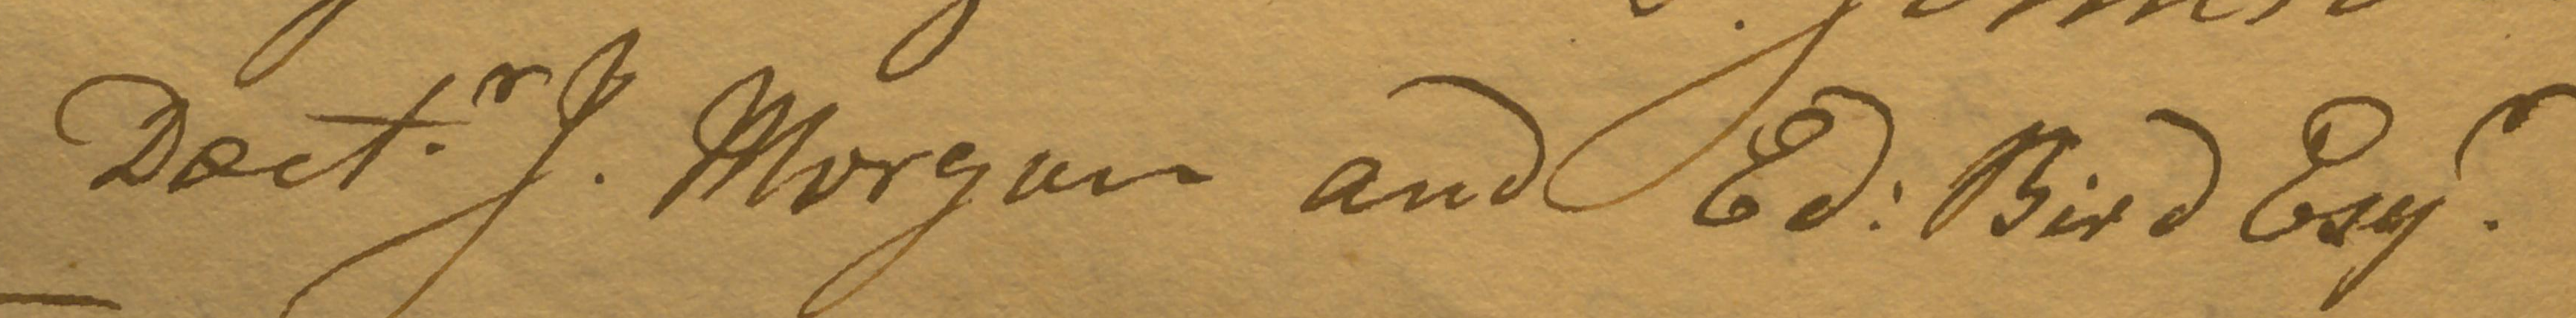Doct^r. J. Morgan and Ed. Bird Esq^r.
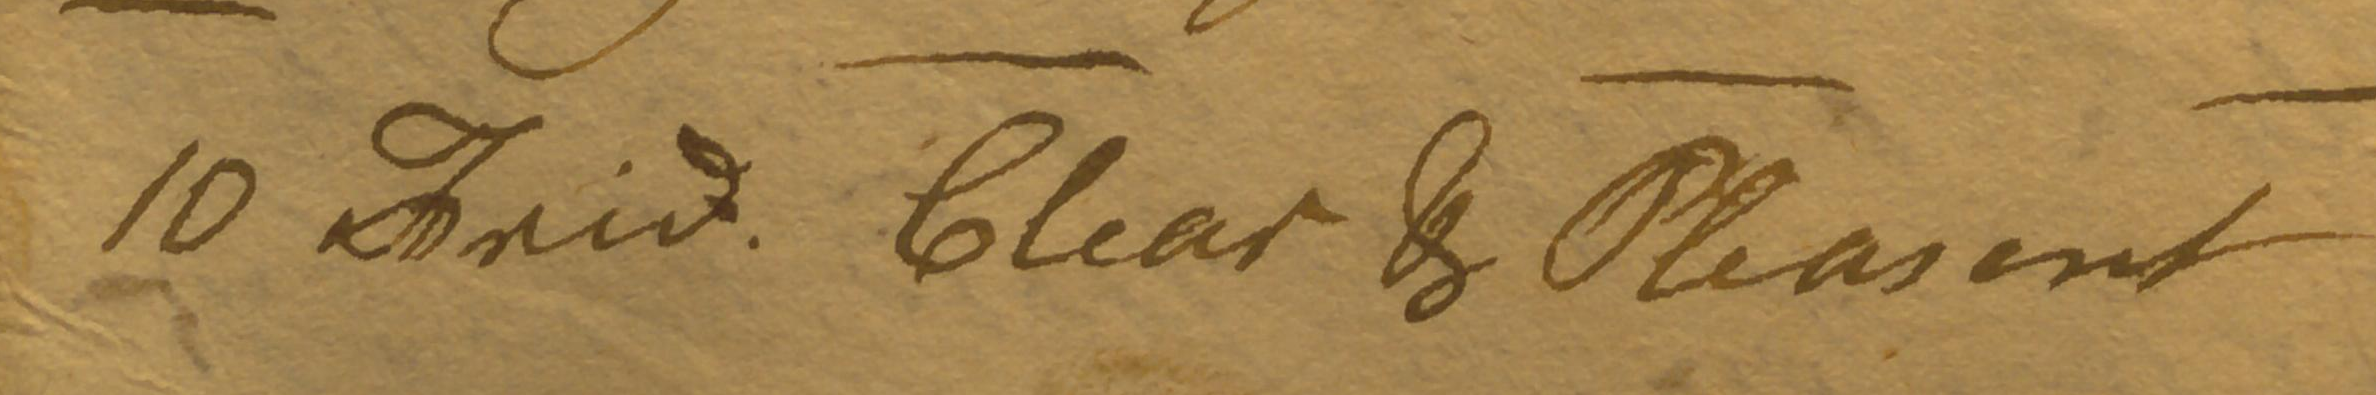10 Frid. Clear & Pleasent
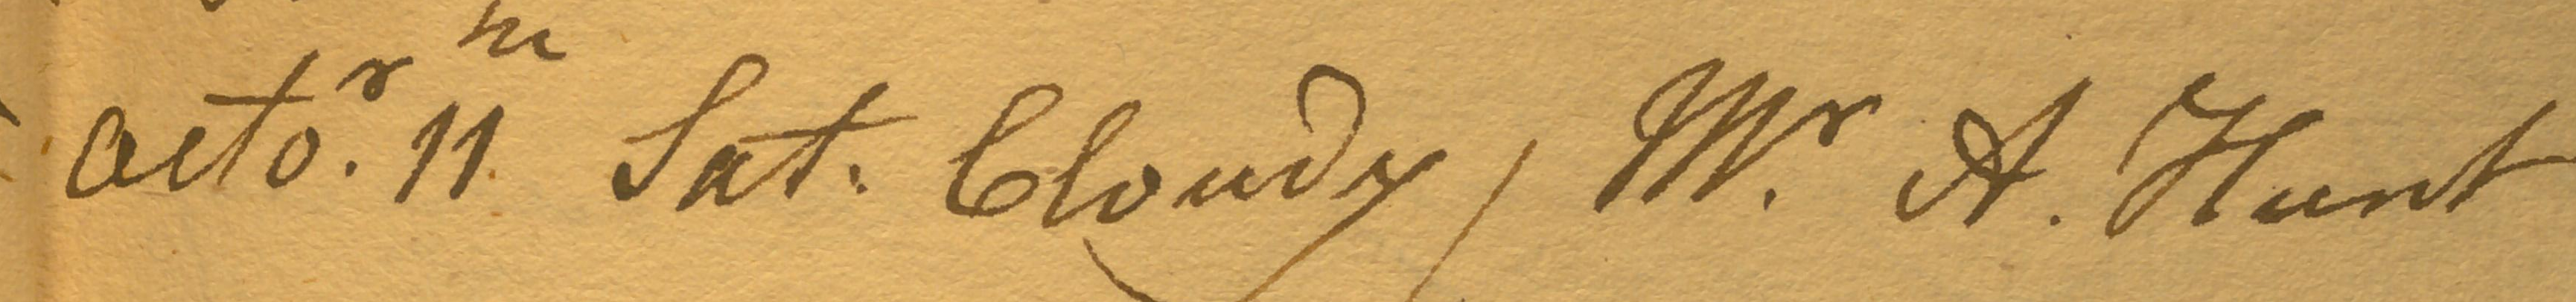Octo^r. 11^th Sat. Cloudy, M^r. A. Hunt
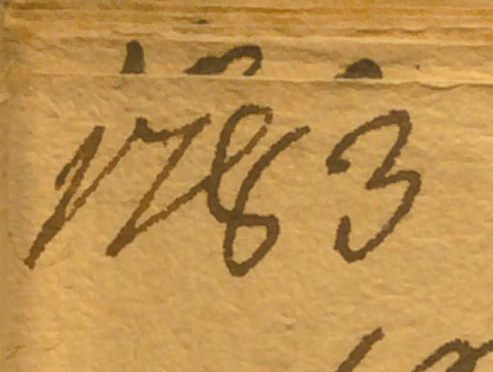1783
